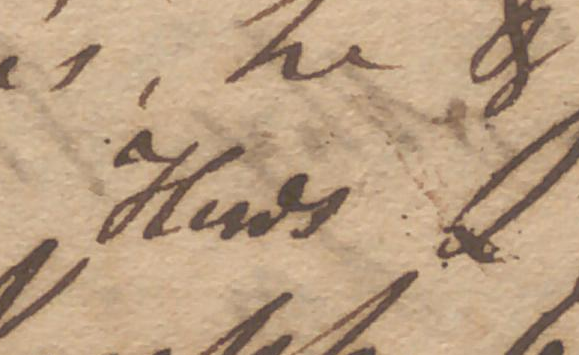Hews
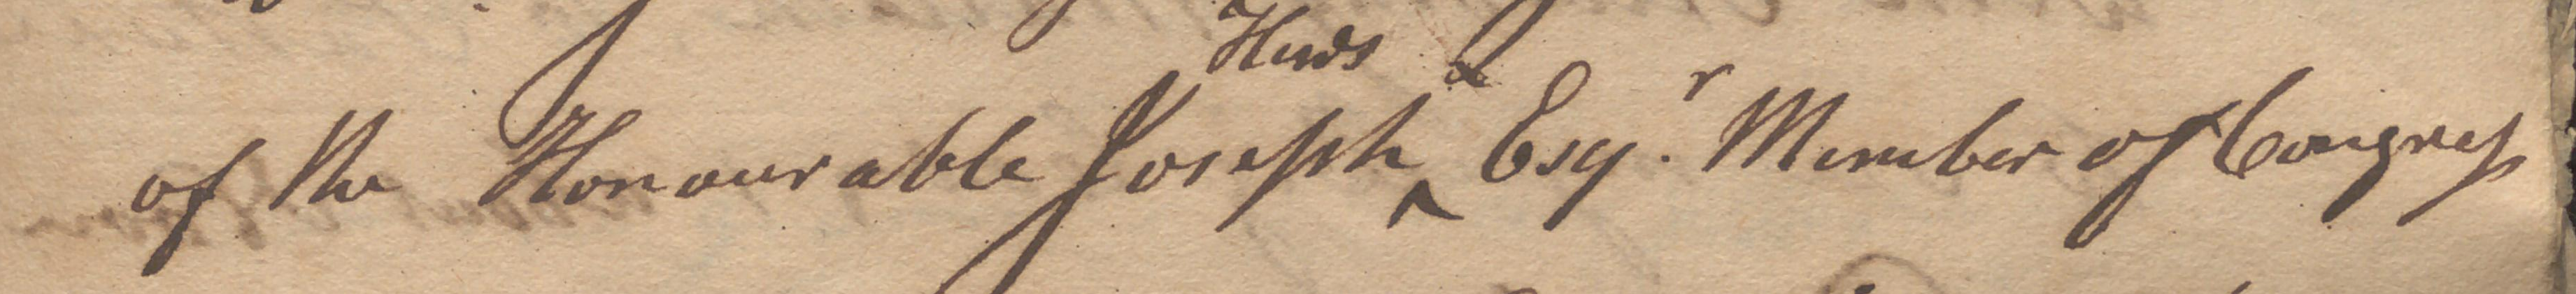of the Honourable Joseph ^ Esq^r. Member of Congress
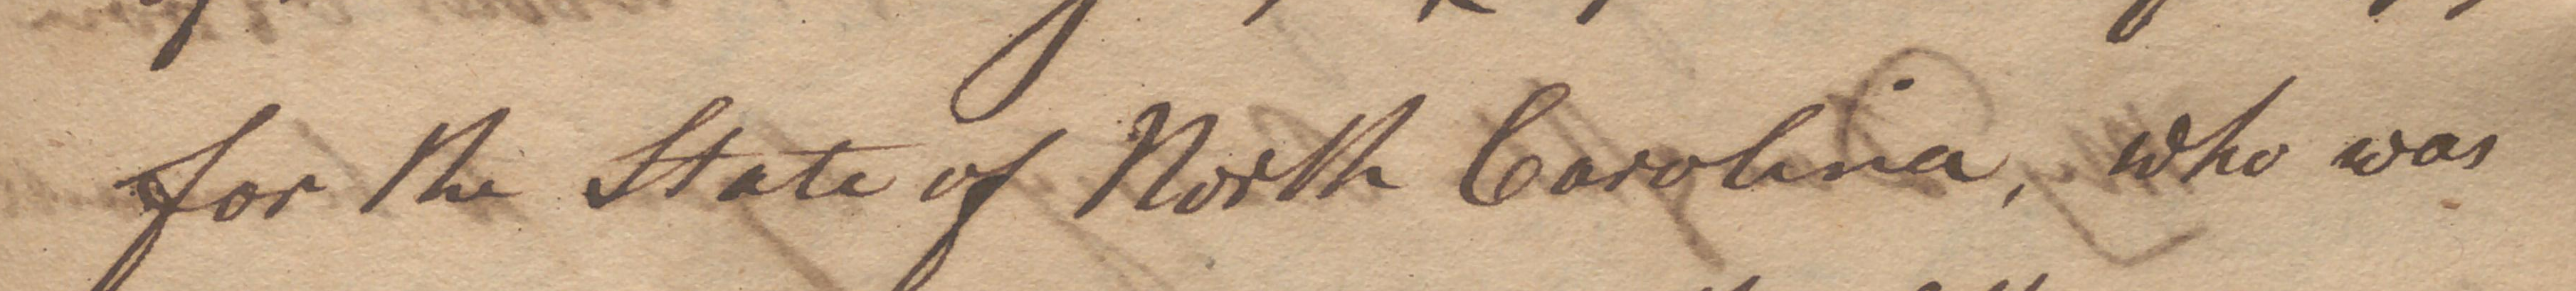for the State of North Carolina, who was
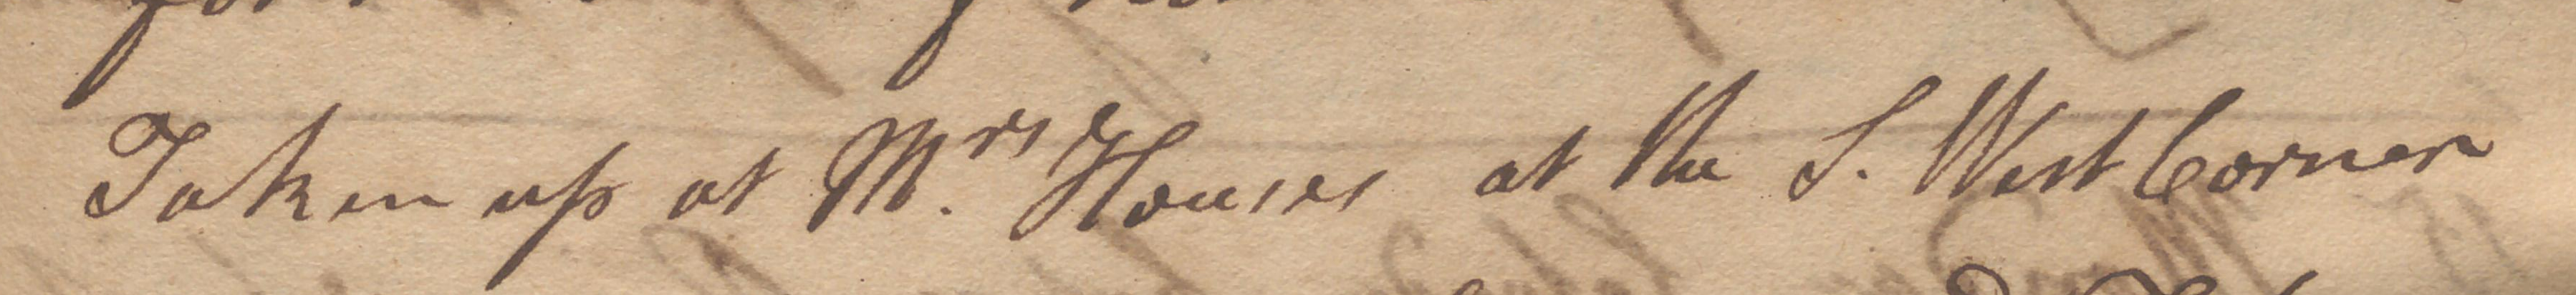Taken up at M^rs. Houses at the S. West Corner
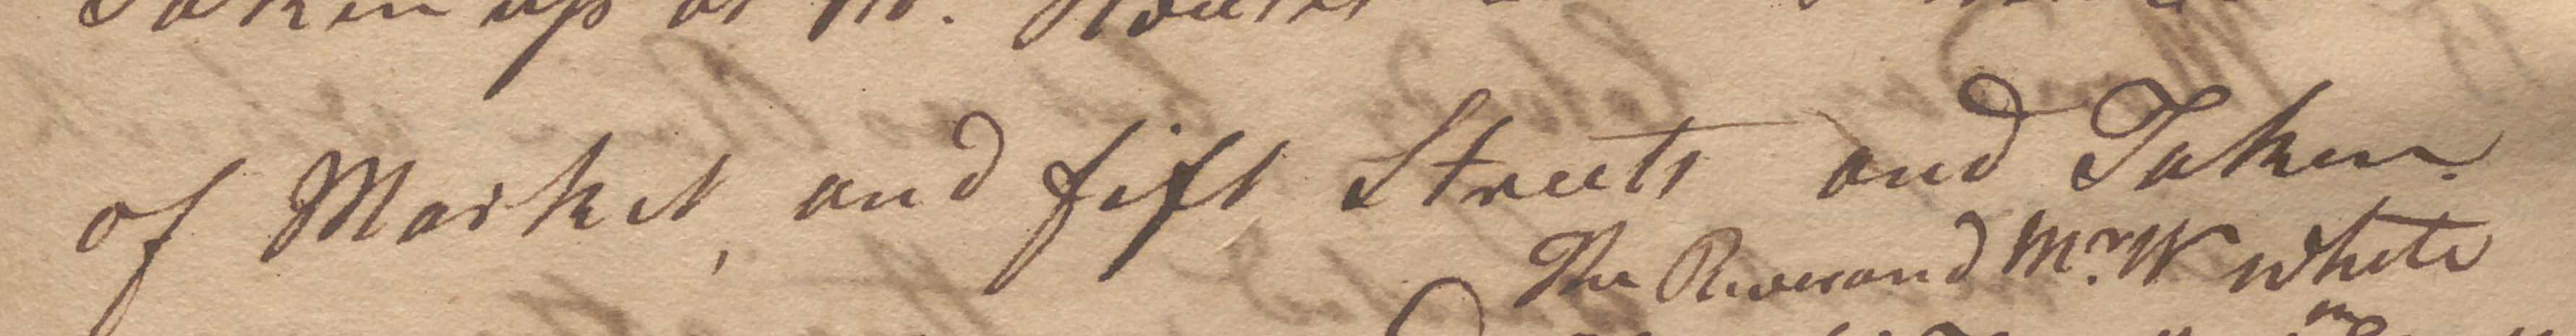of Market and fift Streets and Taken
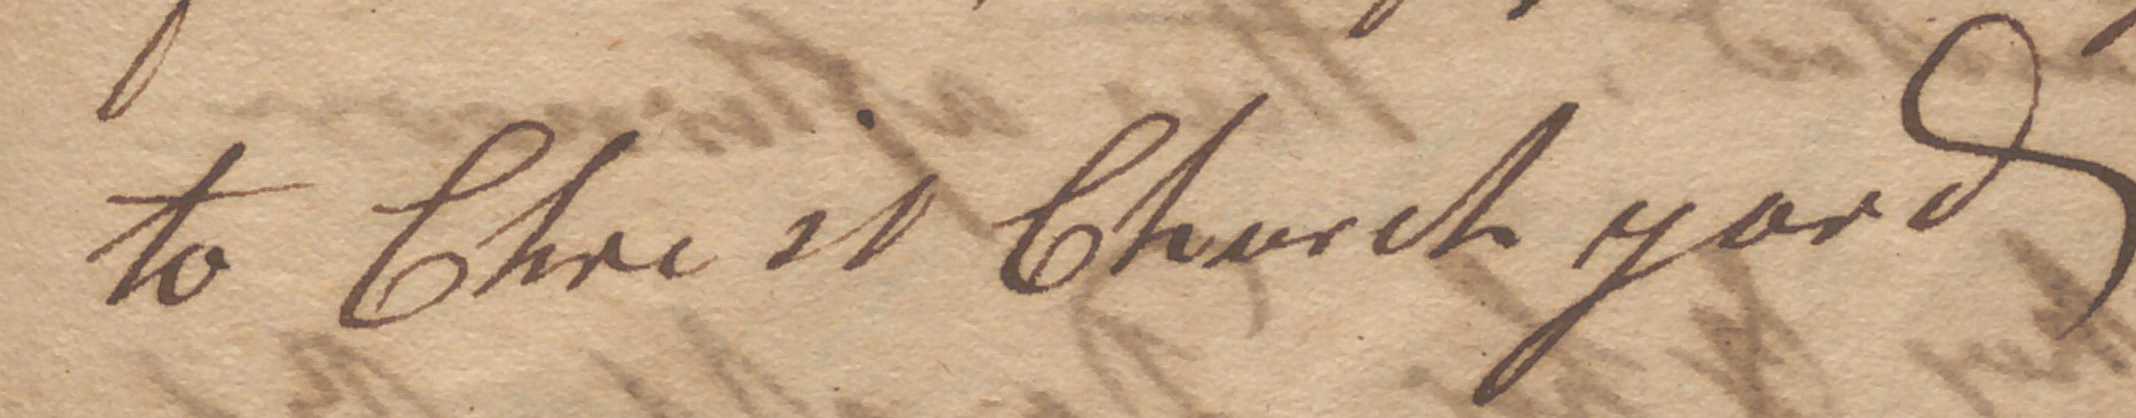to Christ Church yard
